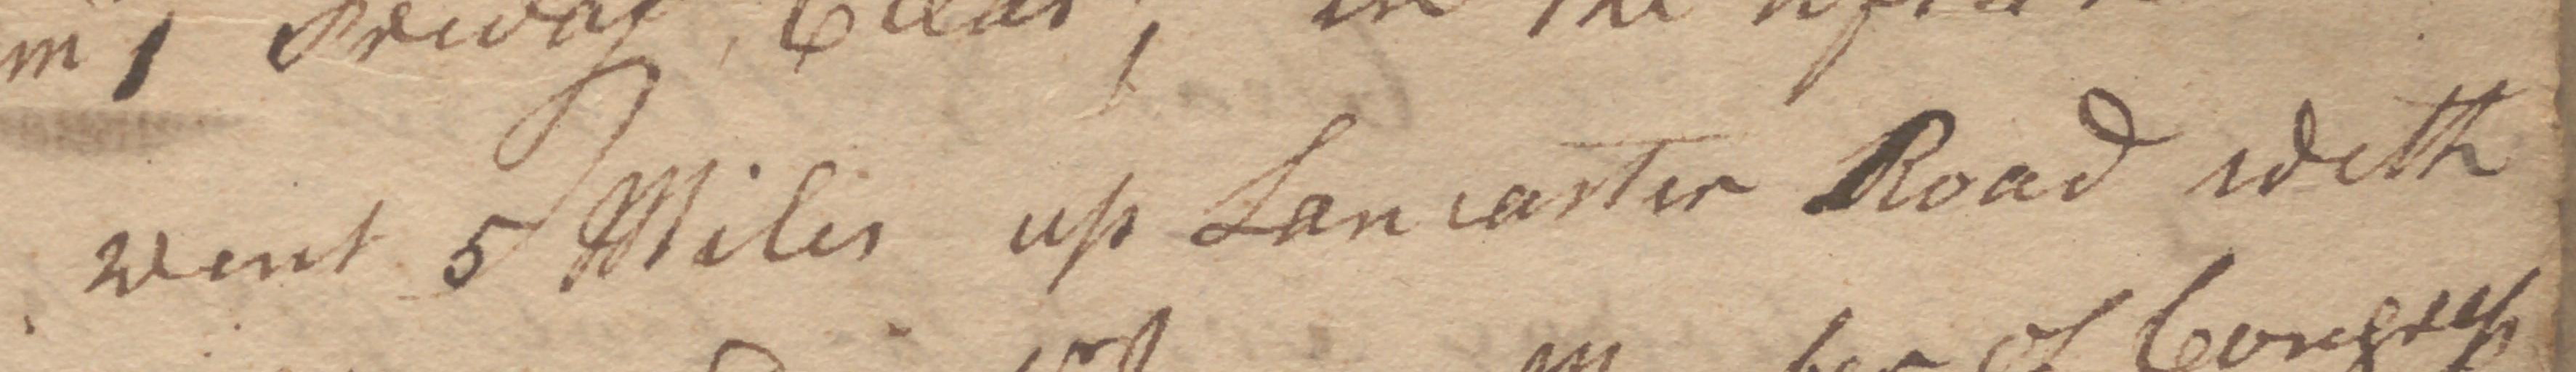went 5 Miles up Lancaster Road with
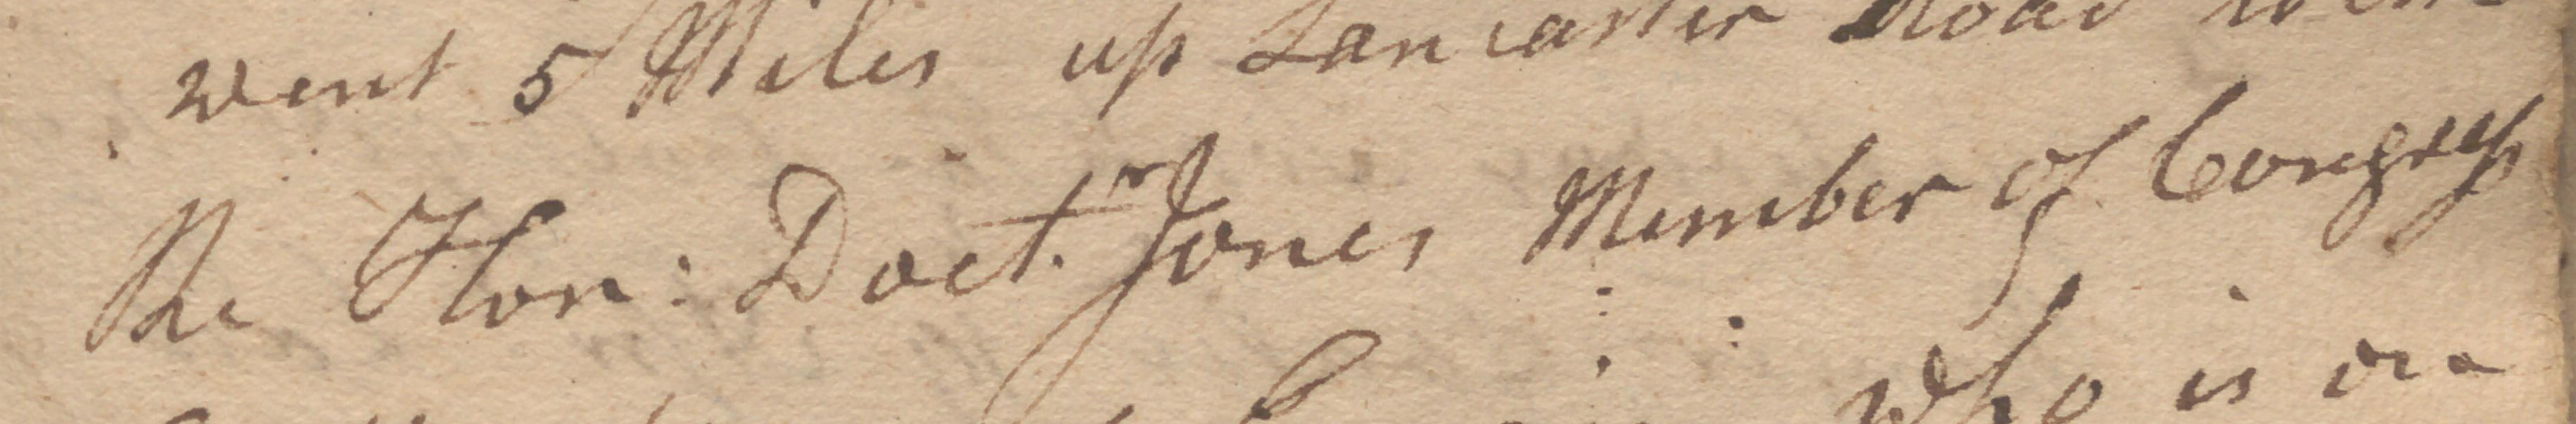the Hon: Doct^r. Jones Member of Congress
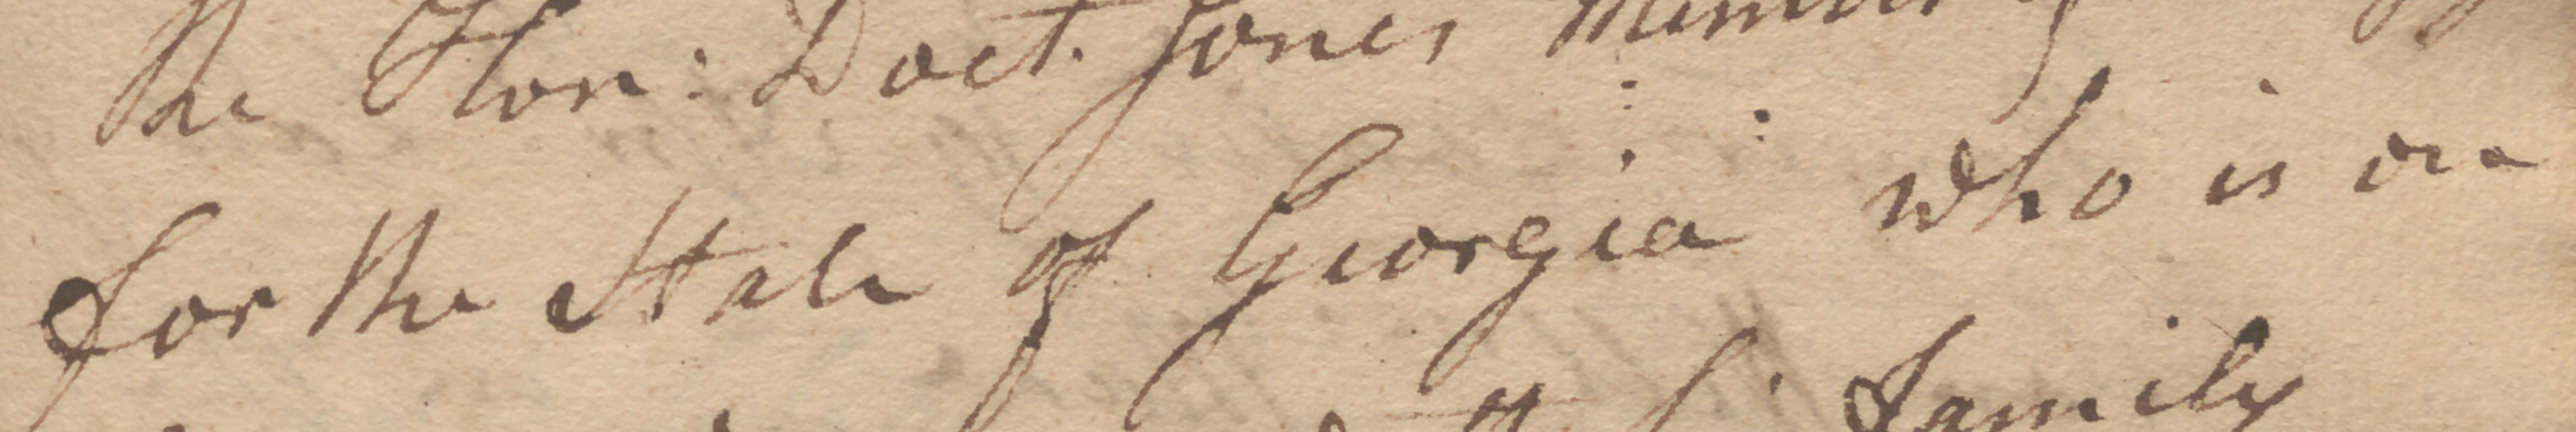for the State of Georgia who is on
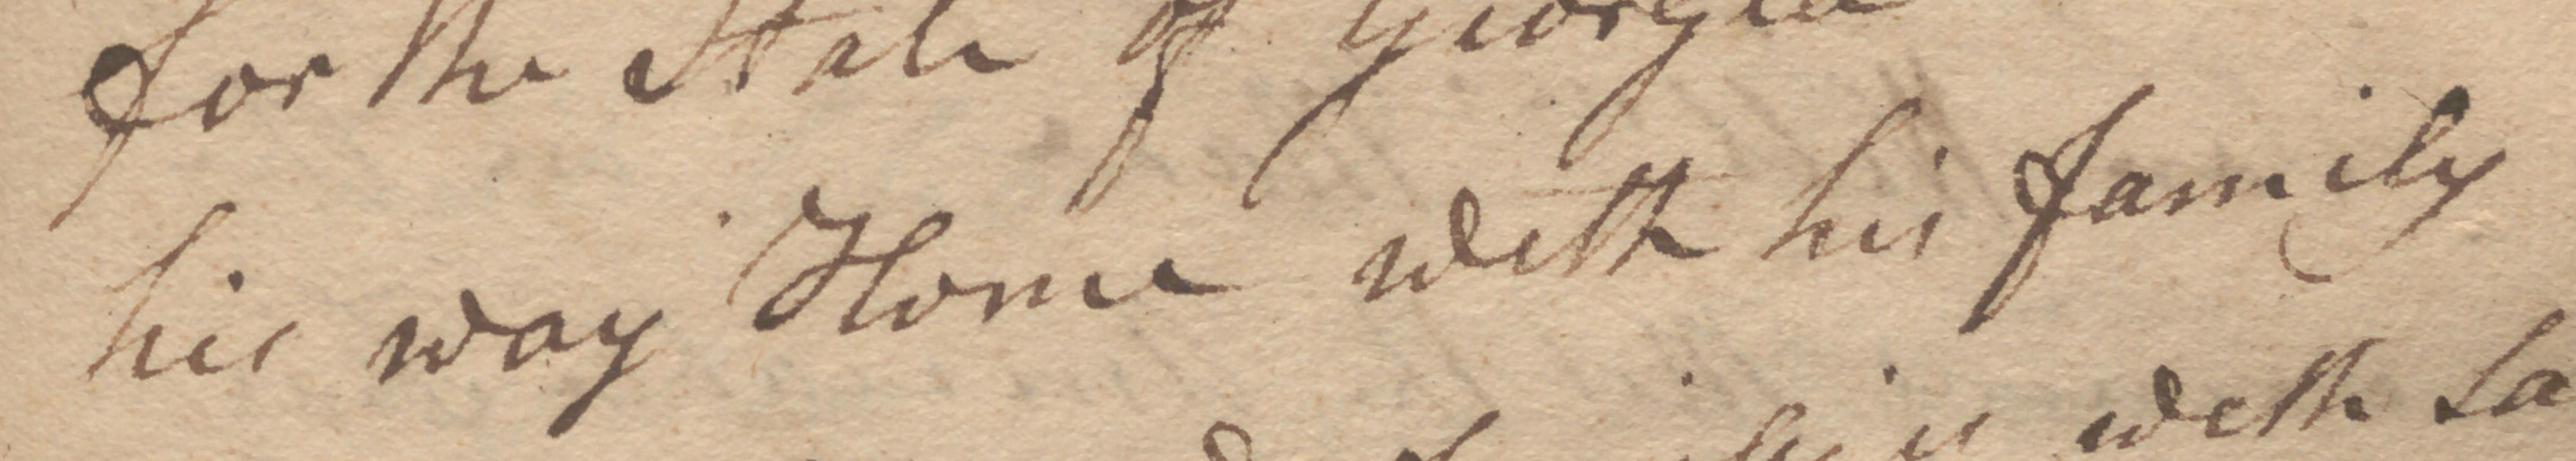his way Home with his family
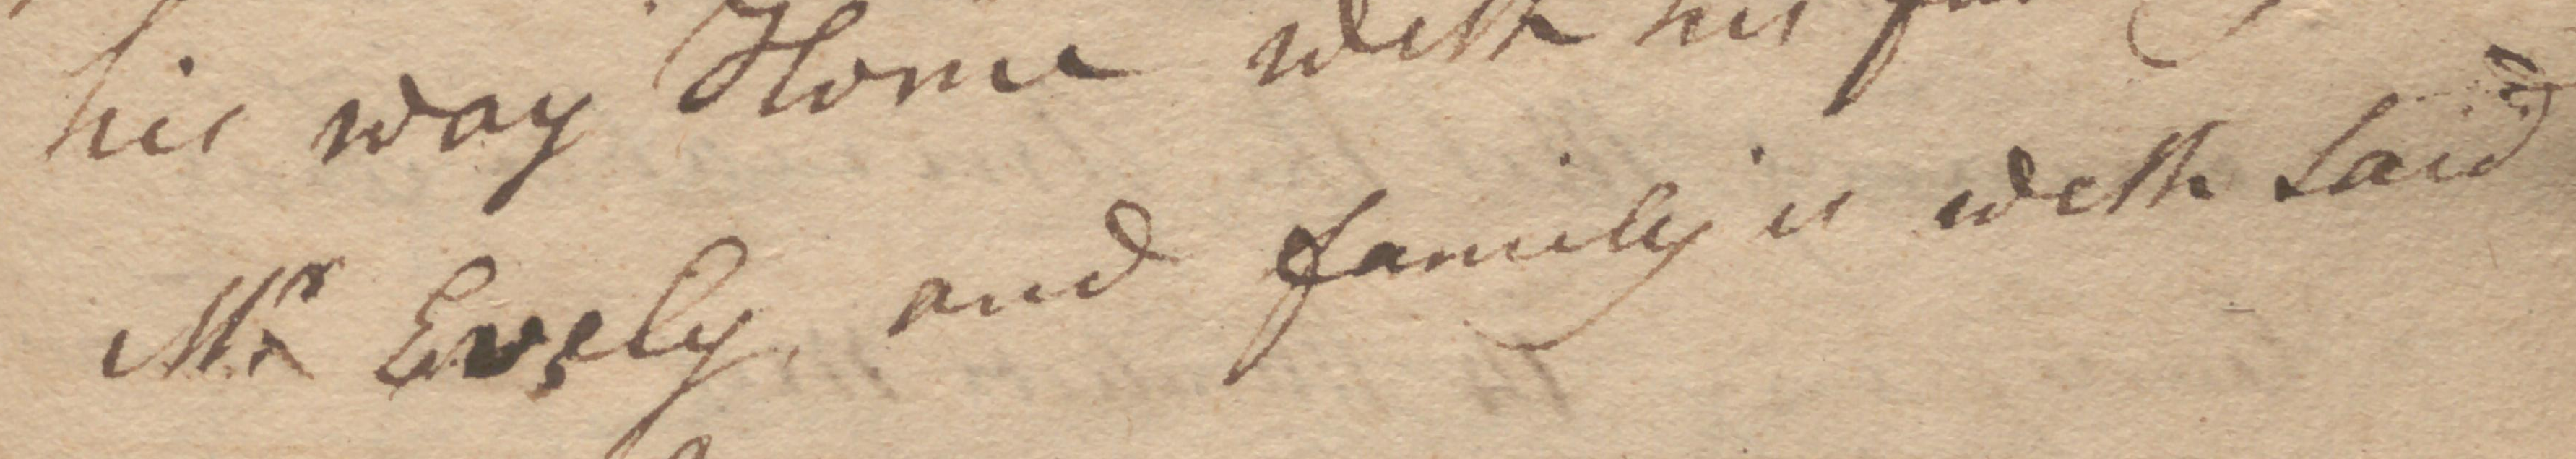M^r. Evely, and family is with said
